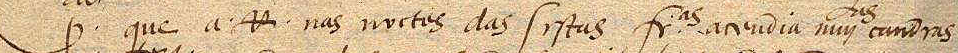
Pra. que a .R. nas noctes das sestas fr.as acendia muytas candeas
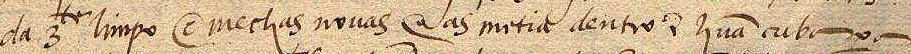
dazte limpo e mechas nouas e as metia dentro ē hūa cuba ꝑa
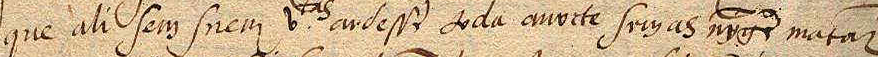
que ali sem serem vtas ardessē toda a nocte sem as n̄ygē matar
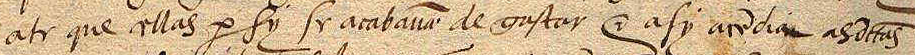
ate que ellas ꝑ sy se acabaūa de gastar e asy acēdia as dc̄tas
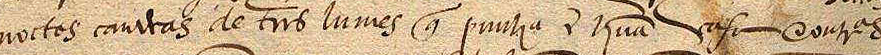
noctes candeas de tres lumes q̄ punha ē hūa casa e outras
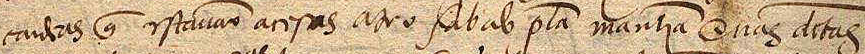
candeas q̄ estauão acesas ate o sabado p̄la manhã e nas d̄ctas
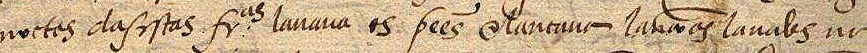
noctes da sestas fras. lauaua os pees e laucaua lancoes lauados na
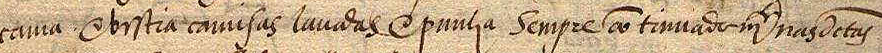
cama. e vestia camisas lauadas e punha Sempre c̄otinuadamte nas d̄ctas
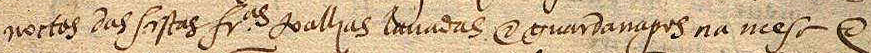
noctes das sestas fras. toalhas lauadas e guardanapos na mesa e
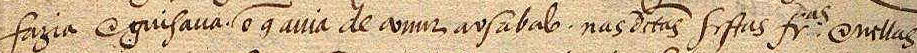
fazia e guisaua. o q̄ auia de comer ao sabado . nas d̄ctas sestas fras. e nellas
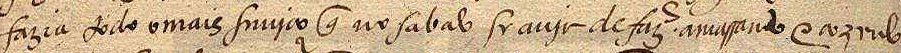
fazia todo o mais serujço q̄ no sabado se auja de faz̄. amassando e cozendo
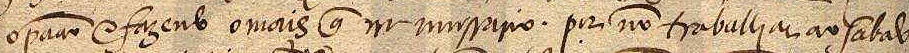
o paão e fazendo o mais q̄ era necessario. por n̄o trabalhar ao sabado
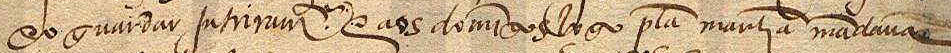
e o guardar Jnteiramte. e aos dom̄jgos logo p̄la manhā m̄adaua
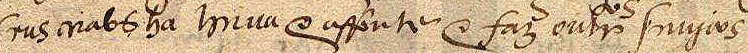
seus criados ha herua e a ffonte e faz̄ outros serujcos
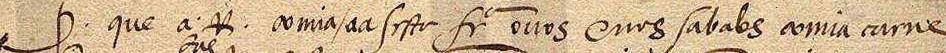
Pra. que a .R. comia / aa sesta fra ouos e nos sabados comia carne
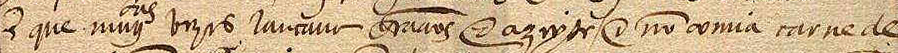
ē que muytas vezes lancaua graãos e azeyte/ e n̄o comia carne de
